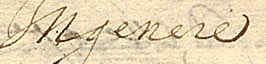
In genere
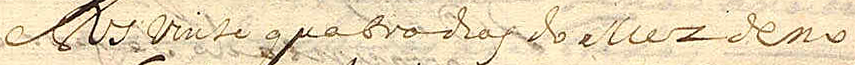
Aos vinte quatro dias do Mez de no
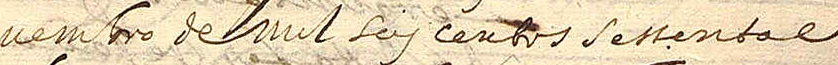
uembro de mil seiscentos sessenta e
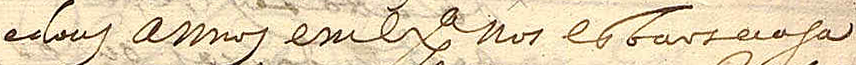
e dous annos em lxa nos estaos e casa
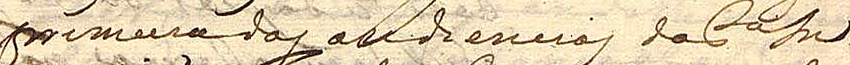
primeira das audiencias da sta In
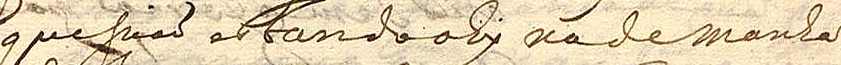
quesicaõ estando ahy na de manhā
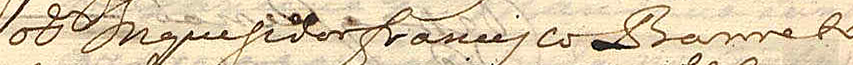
o sor Inquesidor francisco Barreto
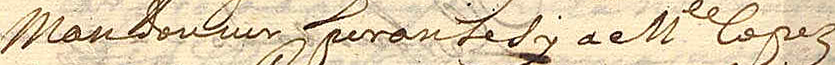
Mandou uir perante sy a Mel lopez
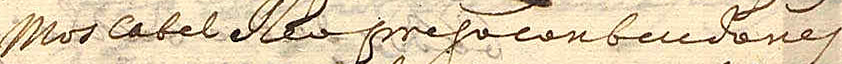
Moscatel Reo preso conteudo nes
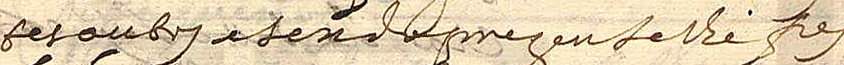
tes autos e sendo prezente lhe foj
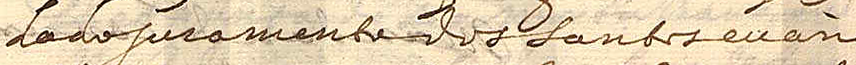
dado juramento dos santos euan
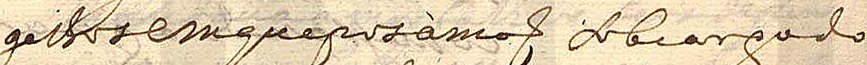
gelhos em que pos a maõ sob cargo do
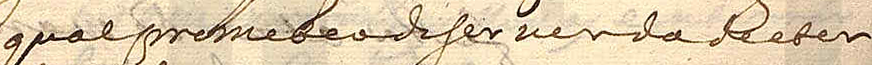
qual prometeo dizer uerdade e ter
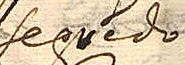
segredo
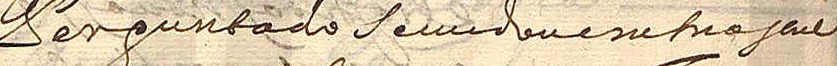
Perguntado se cuidou em suas cul
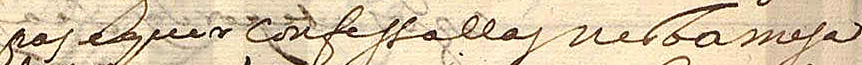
pas e quer confessallas nesta mesa
